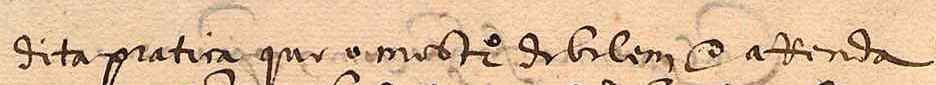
dita pratica que o mostro de belem e aRenda
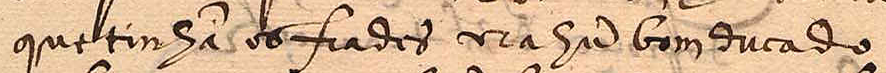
que tinhā os frades era hū bom ducado
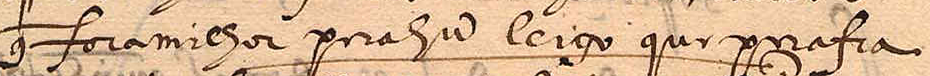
q̄ fora milhor pera hū leigo que pera fra
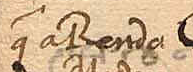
q̄ a Renda
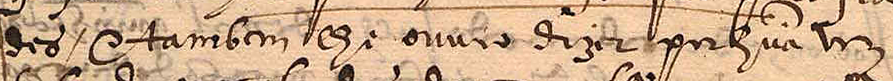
des / e tambem lhe ouuio dizer por hūa vez
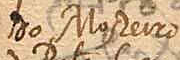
do Mosteiro
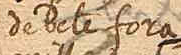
de Belē fora
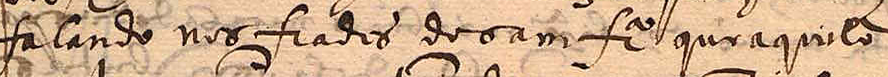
falando nos frades de sam frco que aquilo
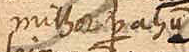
milhor ꝑa hū
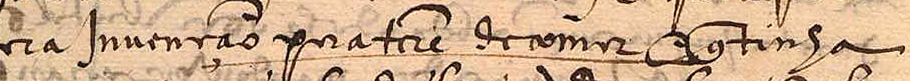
era Jnuenção pera terē de comer e q̄ tinha
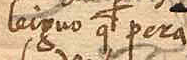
leiguo q̄ pera
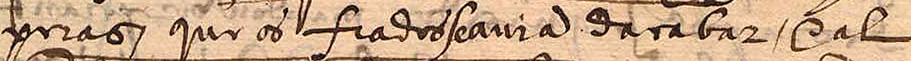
pera sj que os frades se auiā dacabar / e al
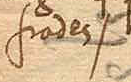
frades /.
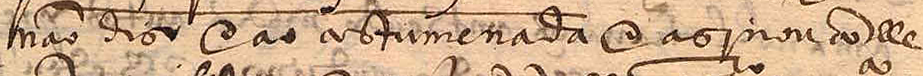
não dise e ao costume nada e asjnou cō elle
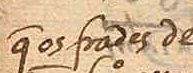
q̄ os frades de
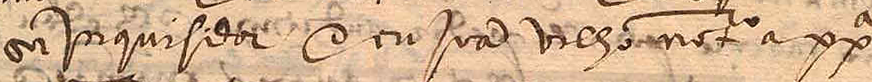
sor̄ Jnquisidor e eu Joā velho notro appco
